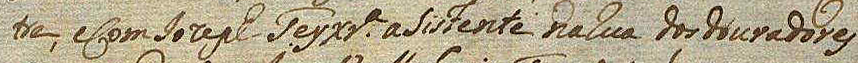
tre, e Com Iozeph Teyxr.a asistente na Rua dos douradores
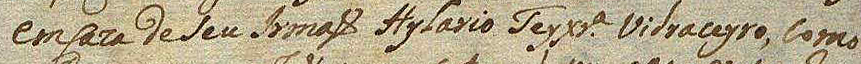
em Caza de seu Irmaõ Hylario Teyxr.a vidraceyro, como
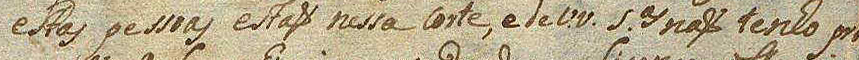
estas pessoas estaõ nessa corte, e de vv. s.as naõ tenho pro
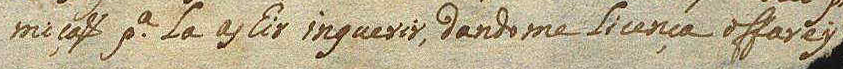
miçaõ p.a la as hir inquerir, dandome licença o ffarey
